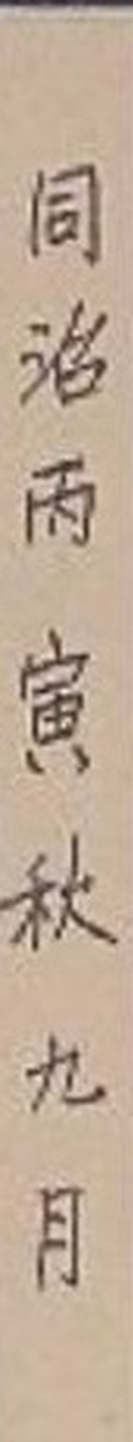同治丙寅秋九月
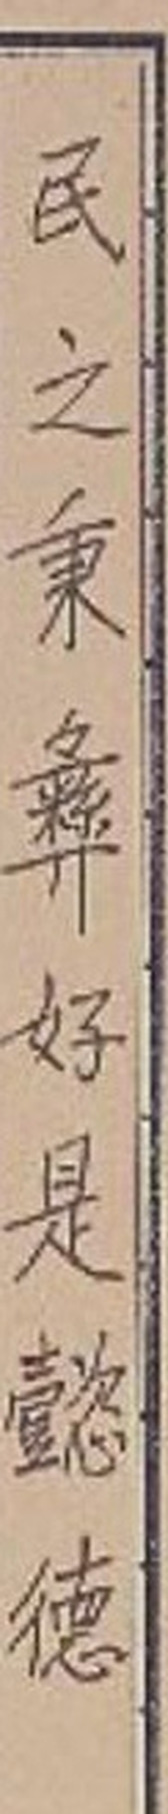民之秉彝好是懿徳
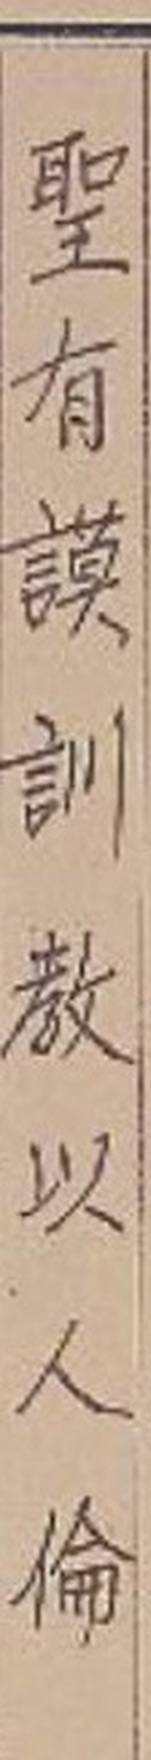聖有謨訓教以人倫
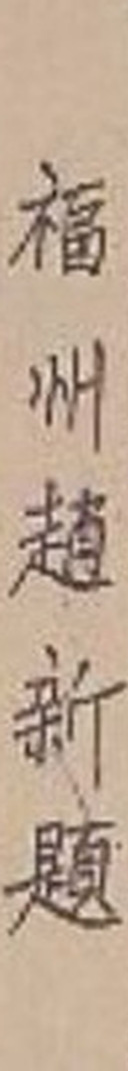福州趙新題
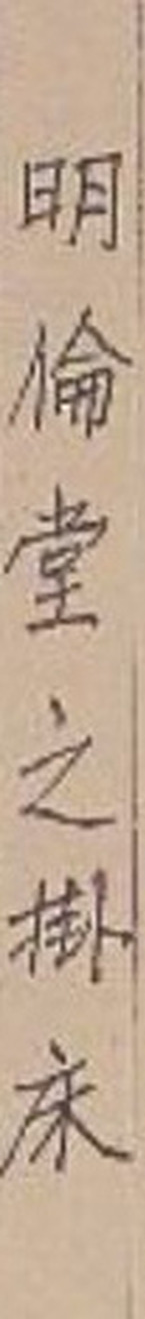明倫堂之掛床
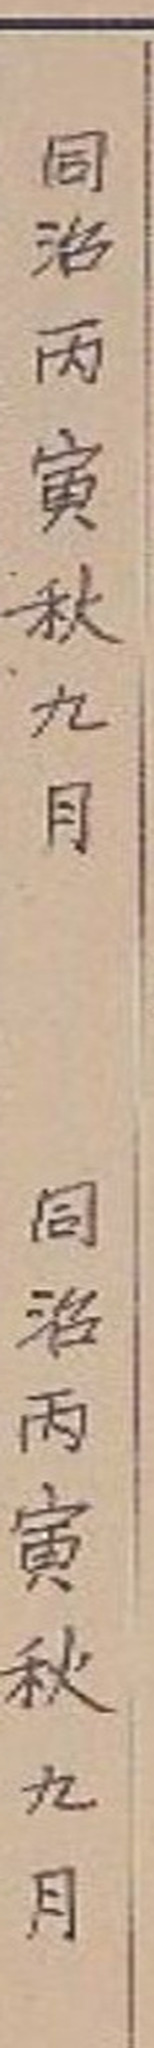同治丙寅秋九月同治丙寅秋九月
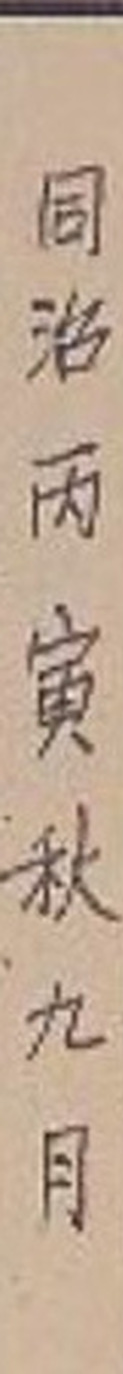同治丙寅秋九月
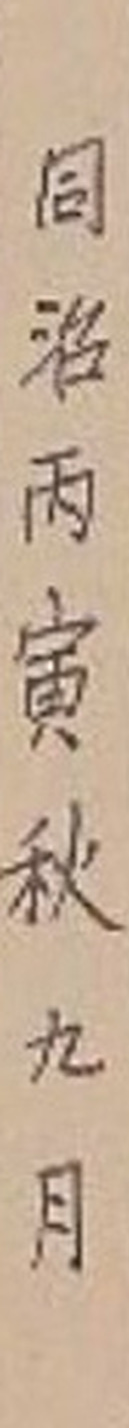同治丙寅秋九月
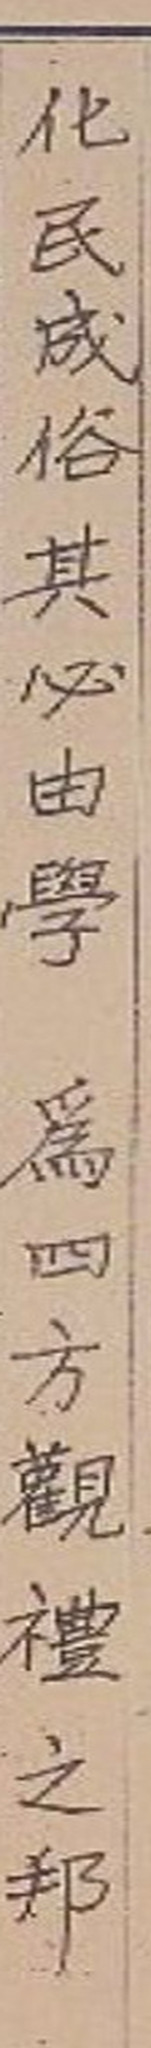化民成俗其必由学為四方観礼之邦
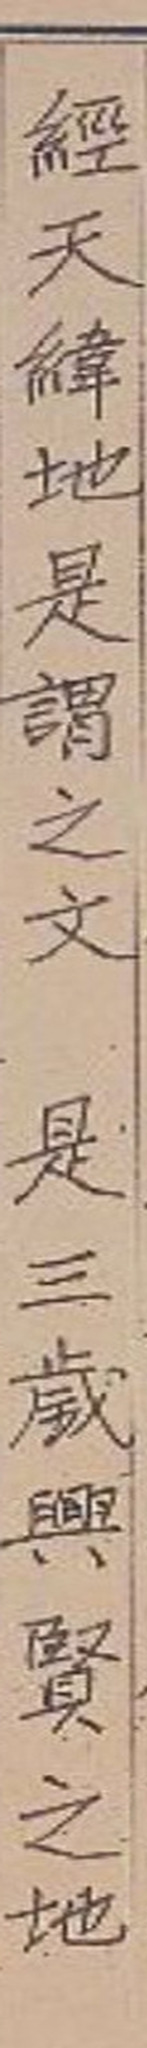経天緯地是謂之文是三歳興賢之地
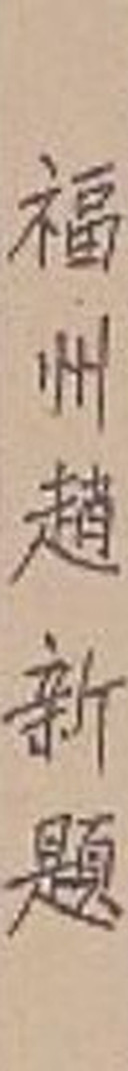福州趙新題
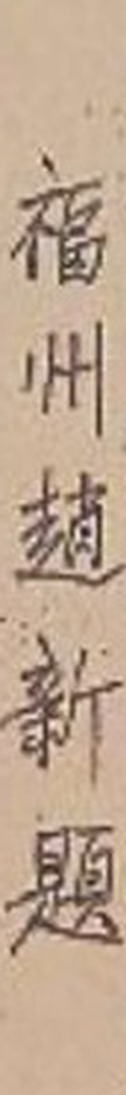福州趙新題
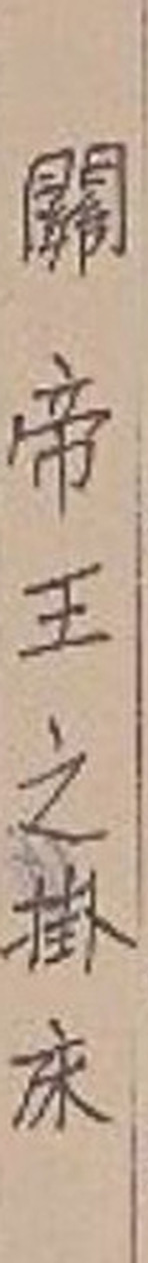関帝王之掛床
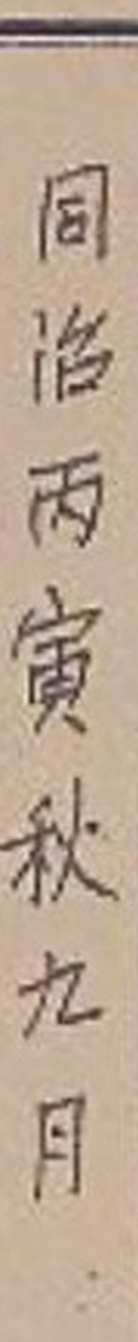同治丙寅秋九月
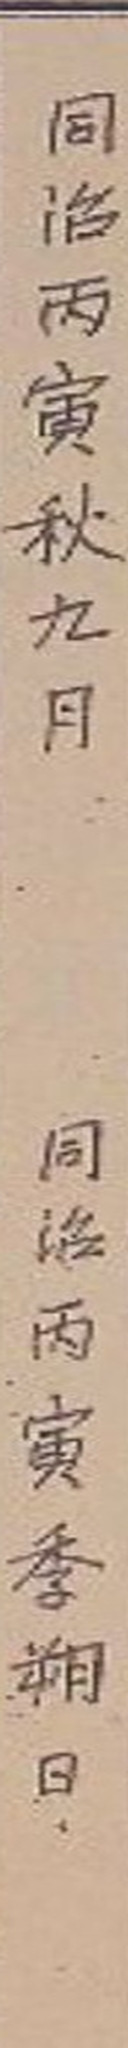同治丙寅秋九月同治丙寅季朔日
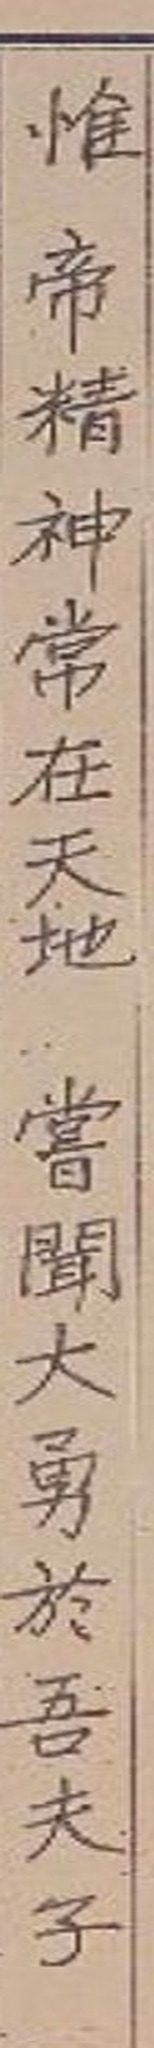惟帝精神常在天地甞聞大勇於吾夫子
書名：支那冊封使来琉諸記 下巻
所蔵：University of the Ryukyus Library
